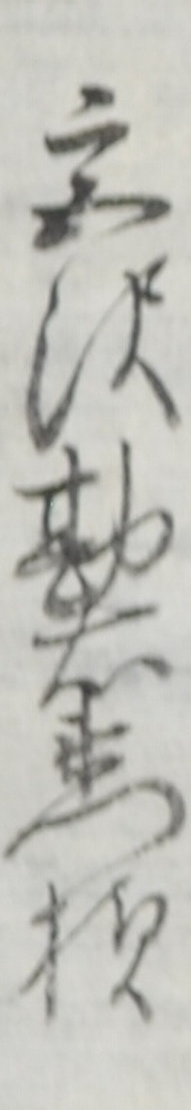宮沢勘右衛門様

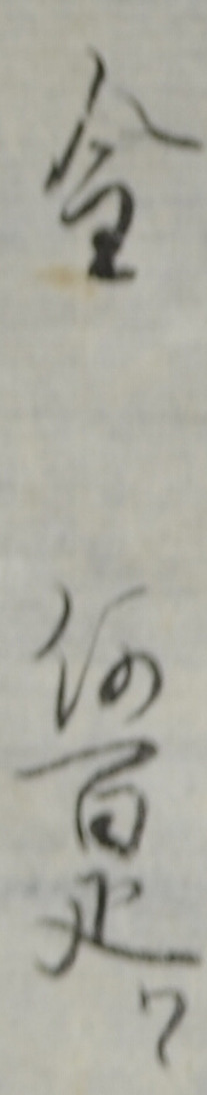金何百疋ツヽ
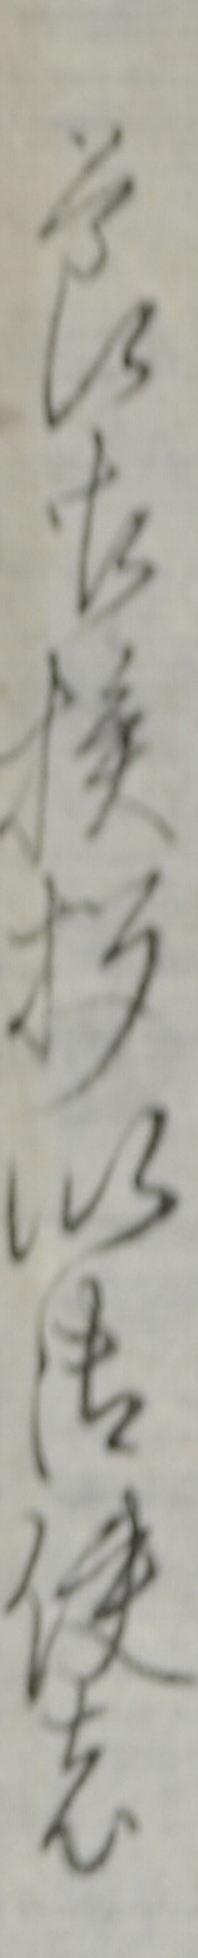節御挨拶以御使者
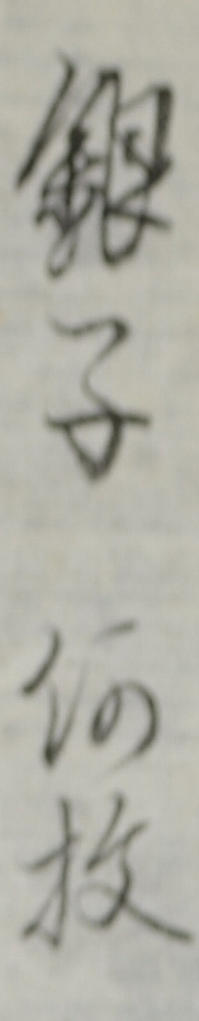銀子何枚
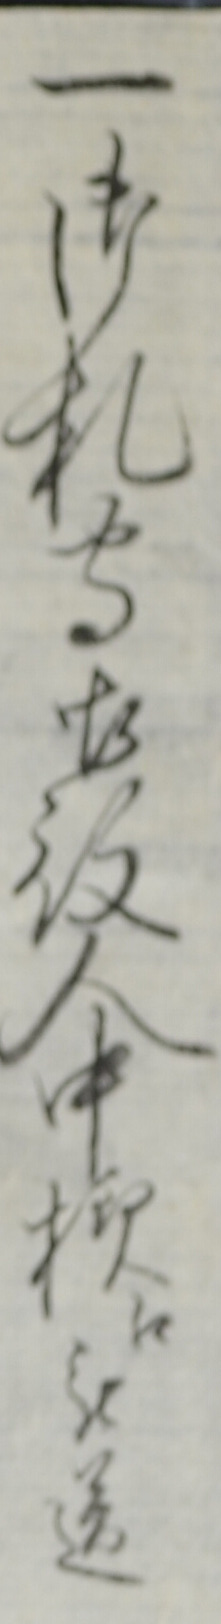一御札守御役人中様江被送
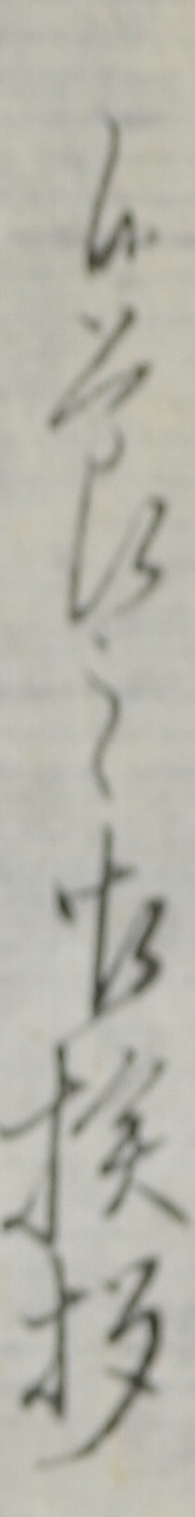候節之御挨拶
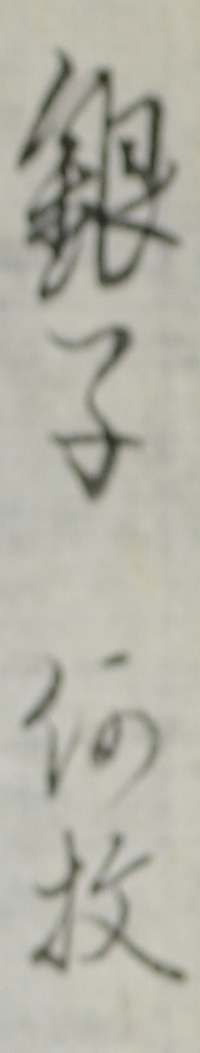銀子何枚
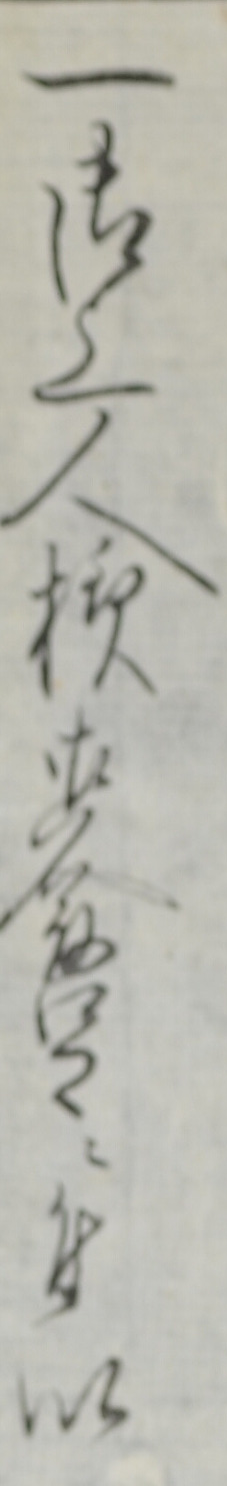一御上人様御発足ニ付以
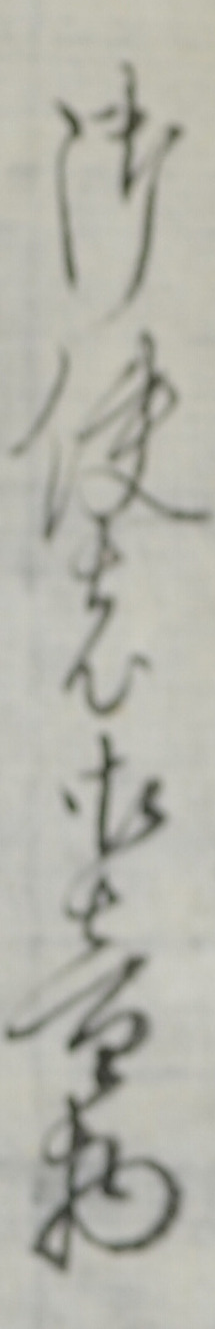御使者御音物
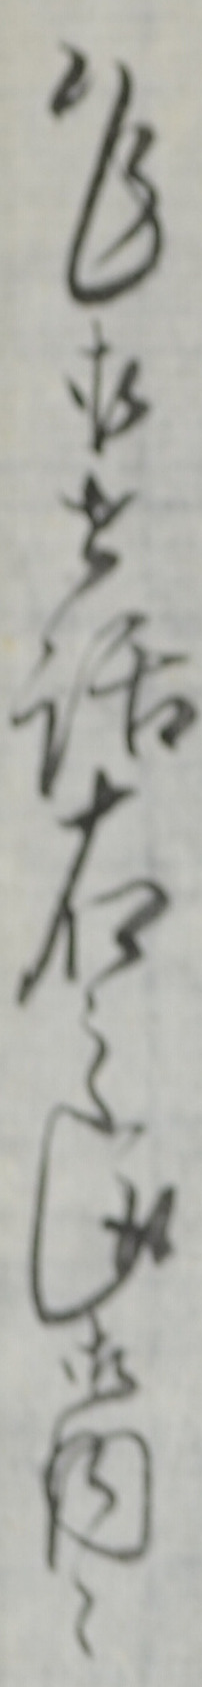乍御世話右之趣御内々
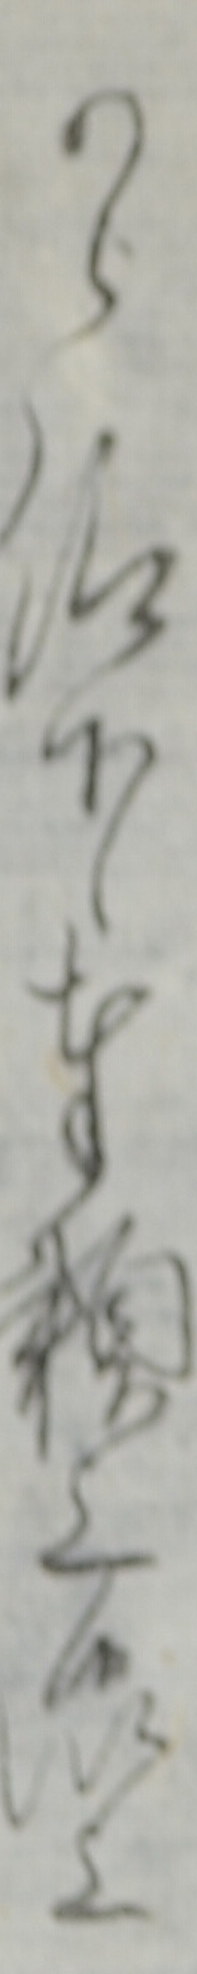可被仰下候奉頼上候以上
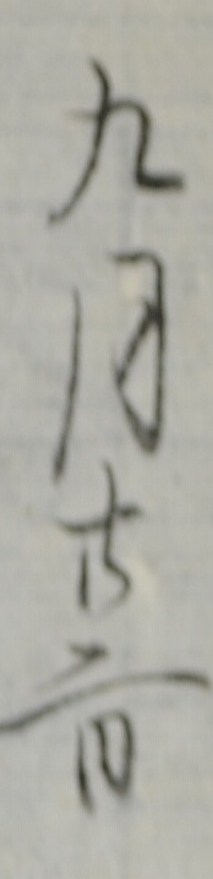九月廿二日

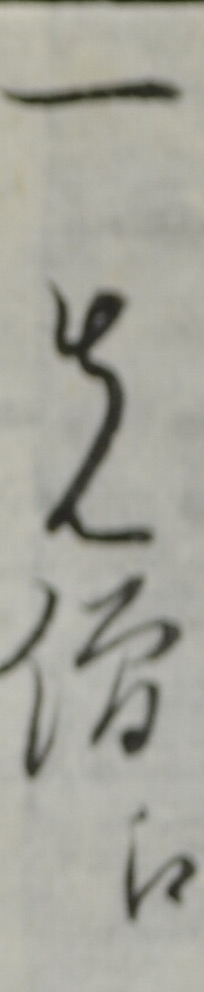一先僧江
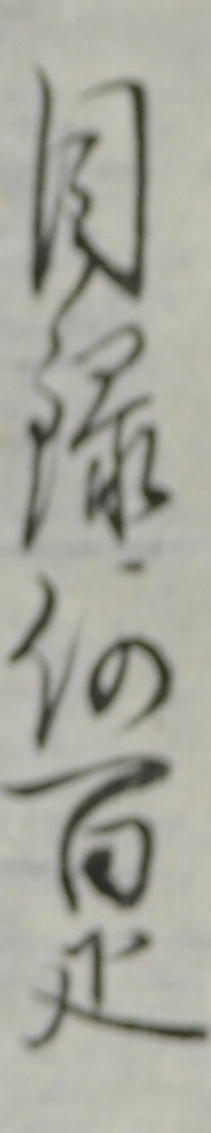目録何百疋
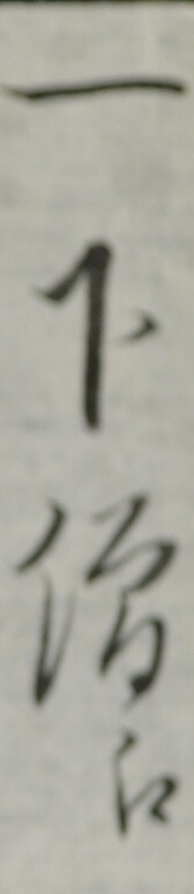一下僧江
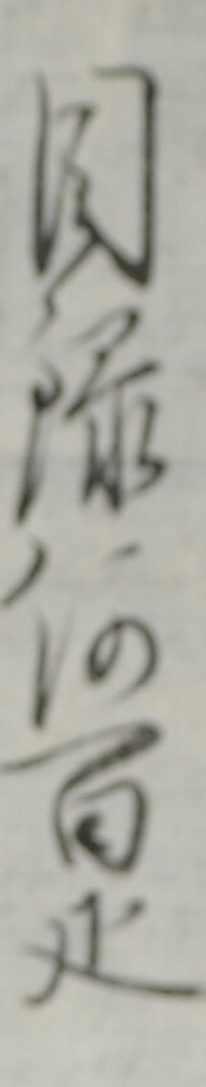目録何百疋
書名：（書状）
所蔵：伊那市立高遠町図書館・合同会社AMANE
